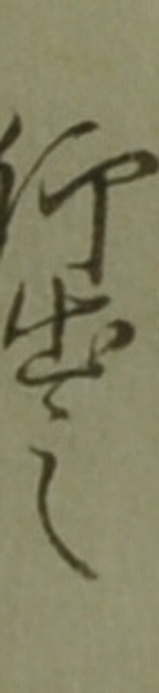仰出之
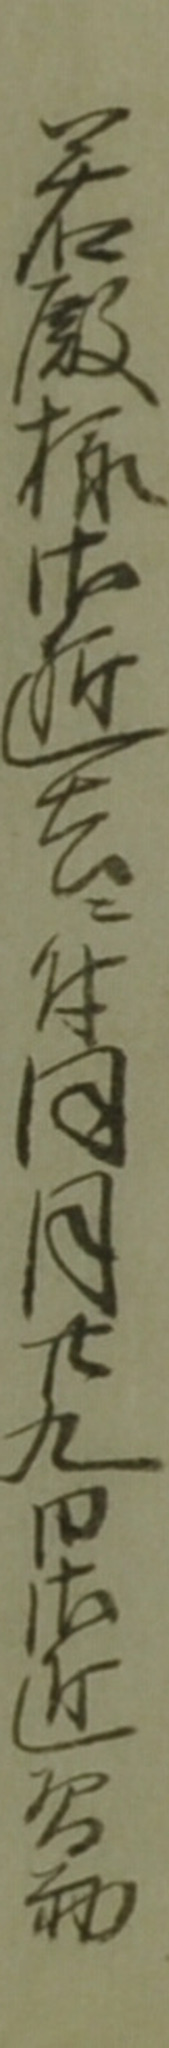若殿様御逝去ニ付同月廿九日御近習勤
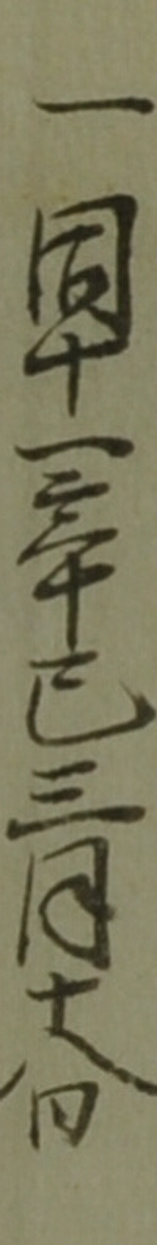一同十一辛巳三月十八日
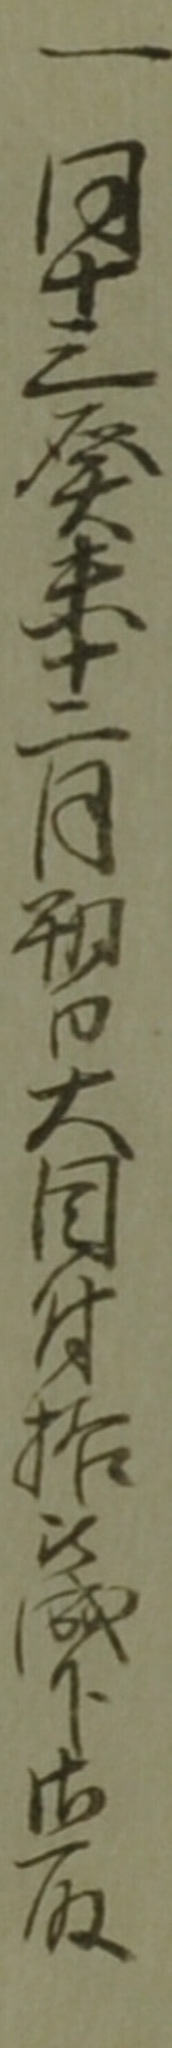一同十三癸未十二月朔日お大目付格被成下御取
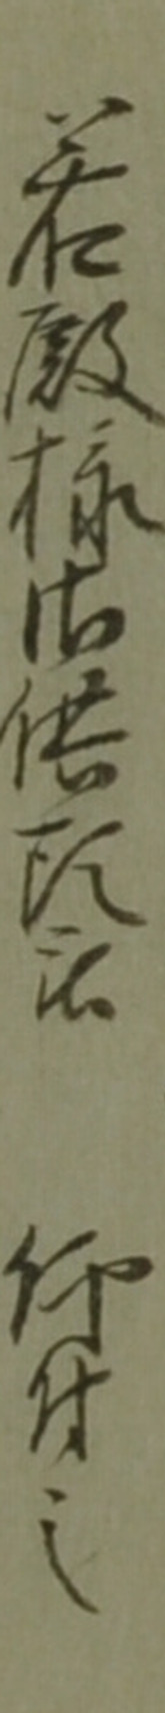若殿様御供頭被仰付之
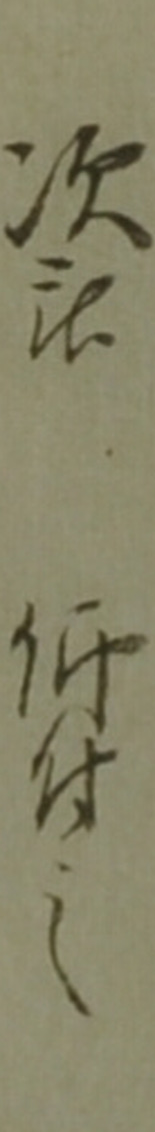次被仰付之
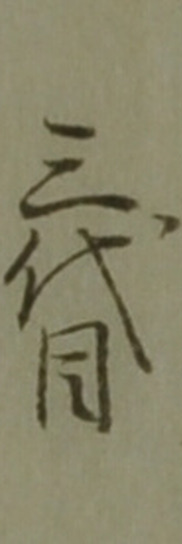三代目
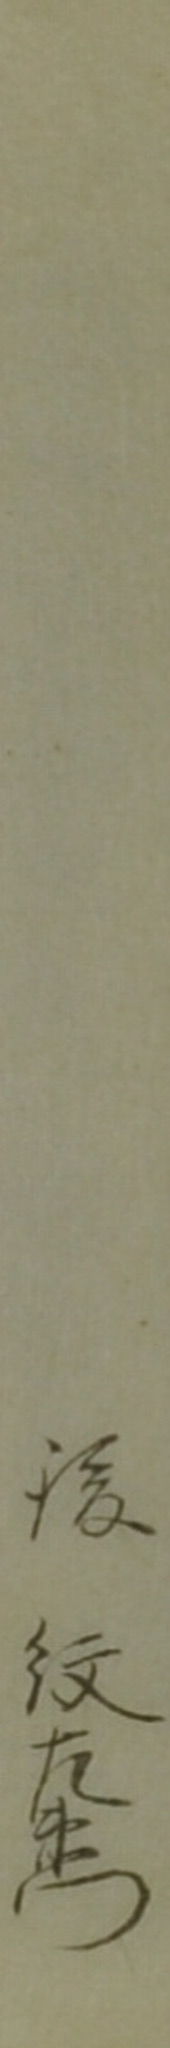後紋左衛門
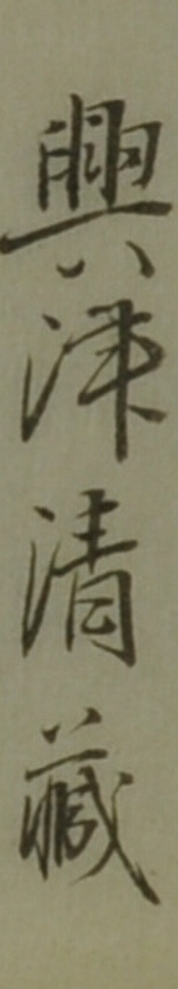興津清蔵
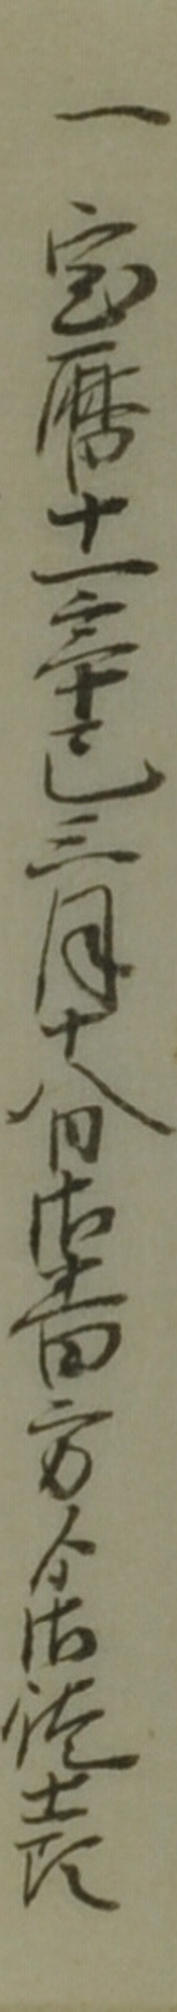一宝暦十一辛巳三月十八日御番方ゟ御徒士頭
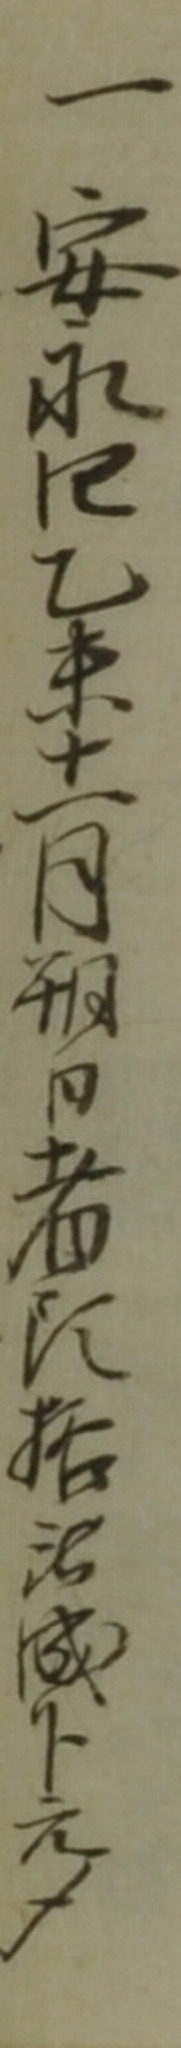一安永四乙未十一月朔日者頭格被成下元〆
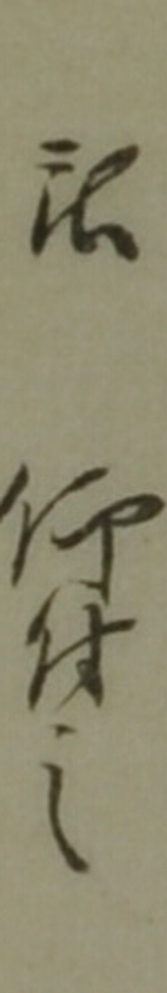被仰付之
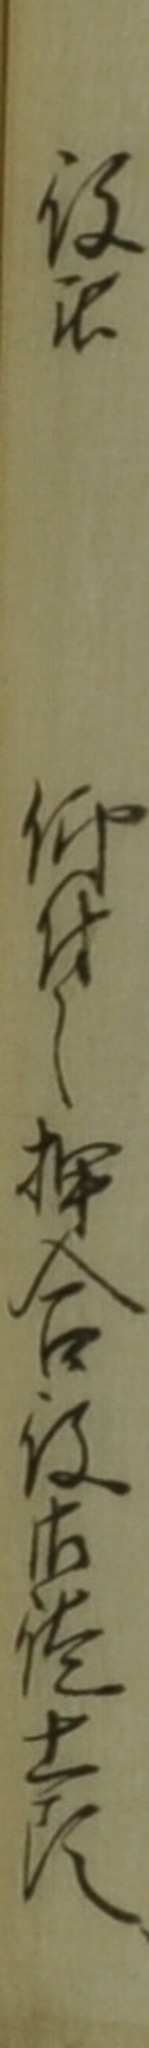役被仰付之押合役御徒士頭
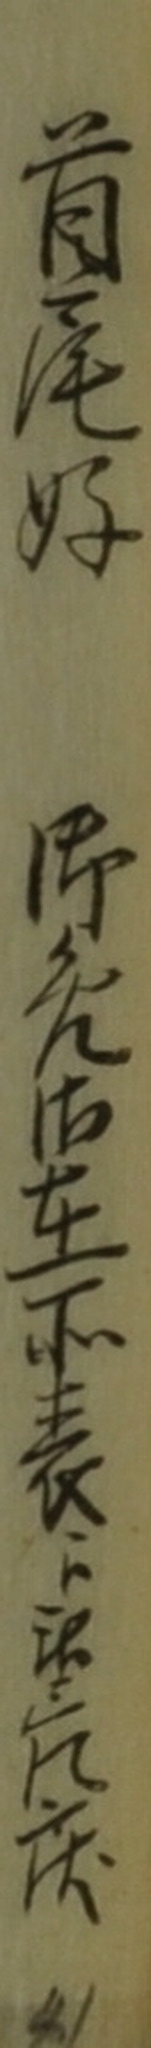首尾好御免御在所表江被◻︎◻︎
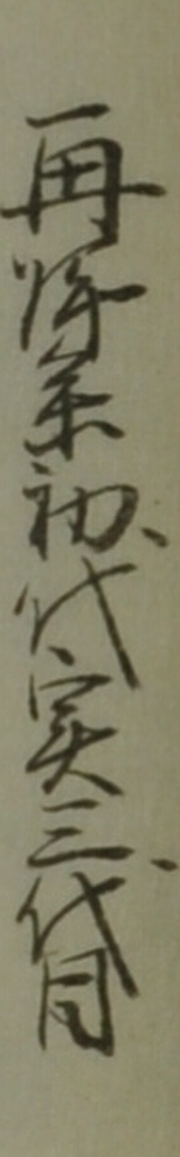再帰参初代実三代目
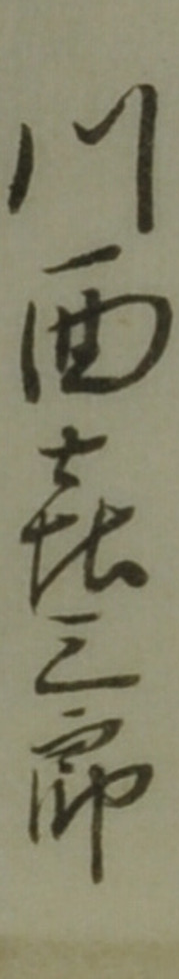川面喜三郎
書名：諸御役代々録（六）
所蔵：伊那市立高遠町図書館・合同会社AMANE
